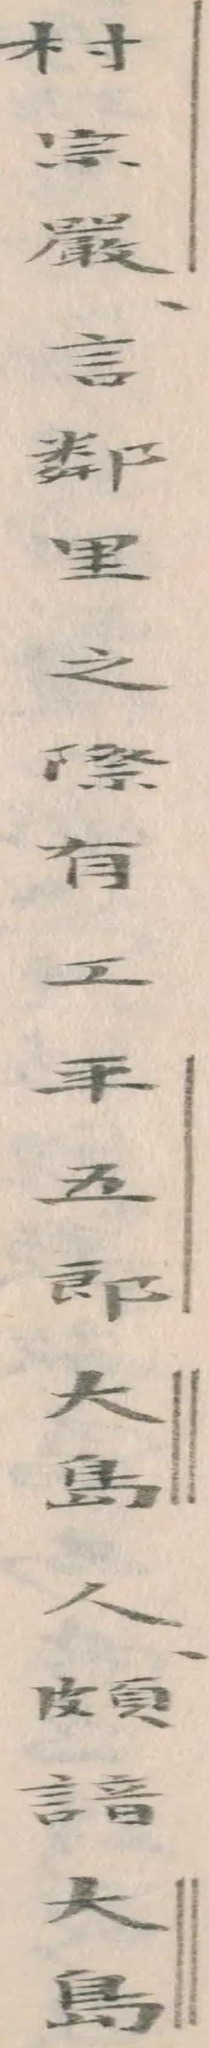村宗厳、言隣里之際有工平五郎大島人、頗諳大島
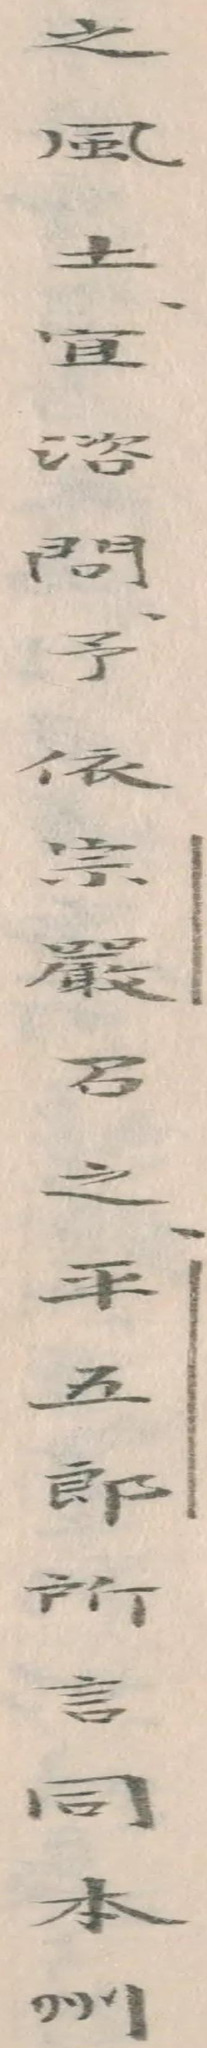之風土、宜諮問、予依宗厳召之、平五郎所言同本州
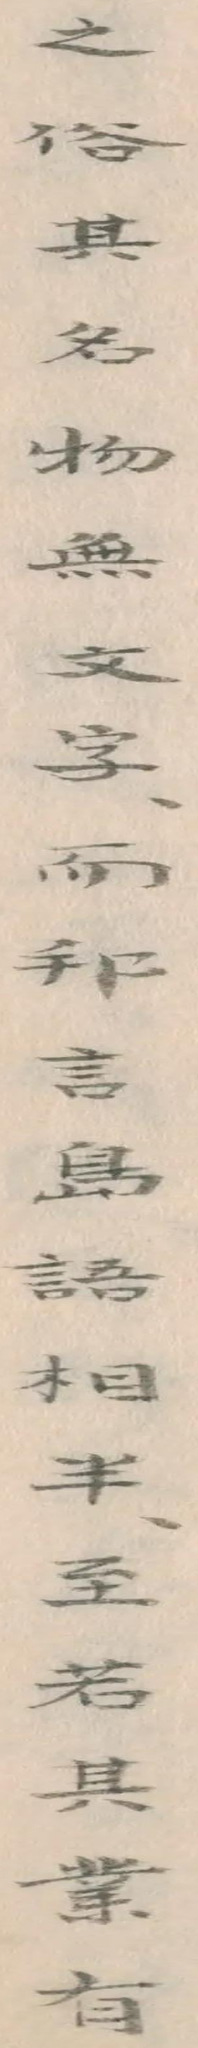之俗其名物無文字、而邦言島語相半、至若其業有

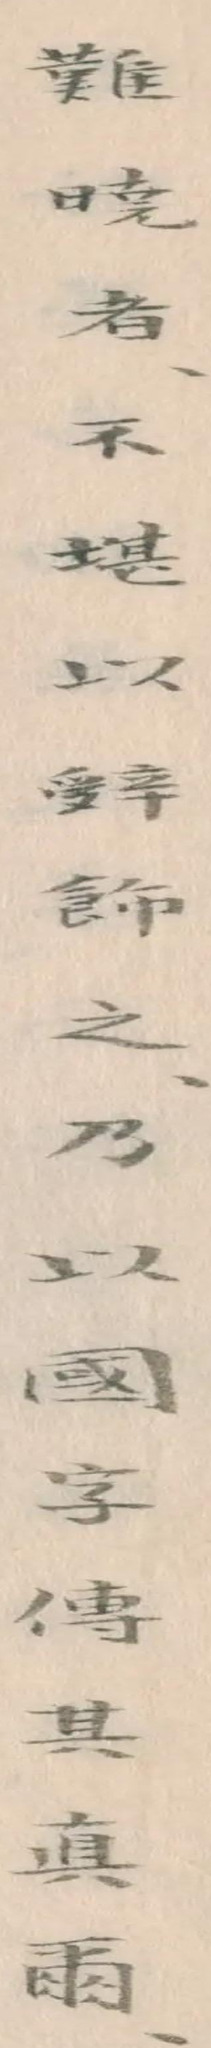難暁者、不堪以辞飾之、乃以国字伝其真尓、
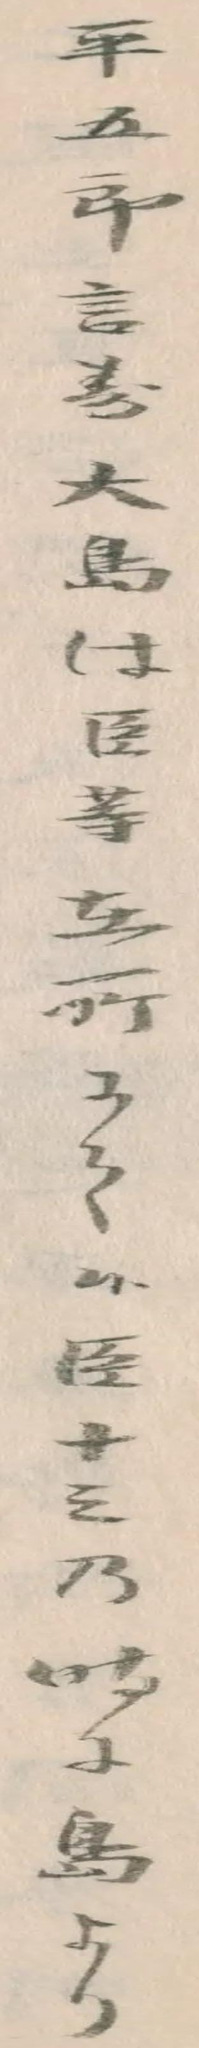平五郎言す大島は臣等在所にて候臣十三の時に島より
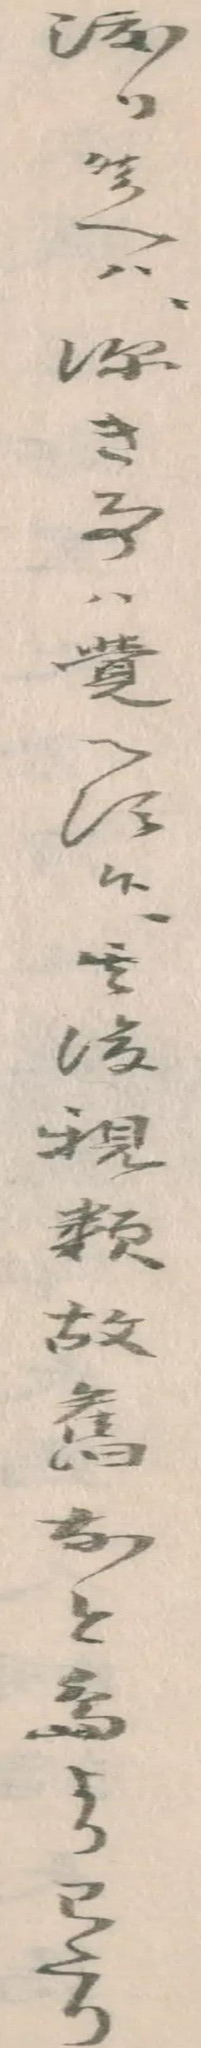渡り候へは、深き事は覚へす候、其後親類故旧なと島よりわたり
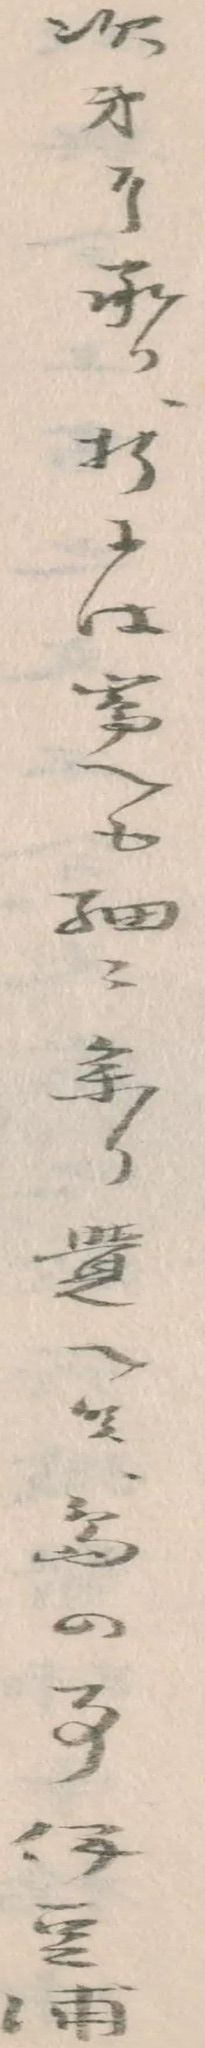次第に承り、折には嶌へも細々参り覚へ候、島の事伊豆浦
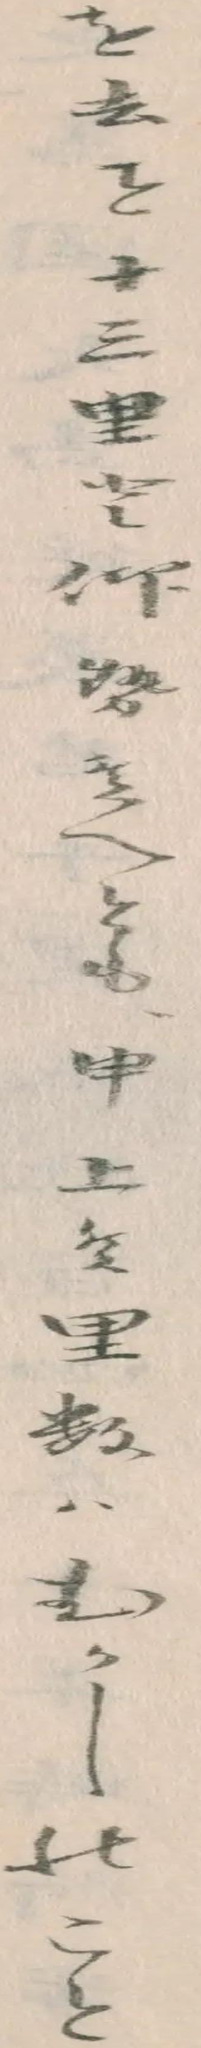を去こと十三里と仰せ候へとも、申上候里数はむかしのこと
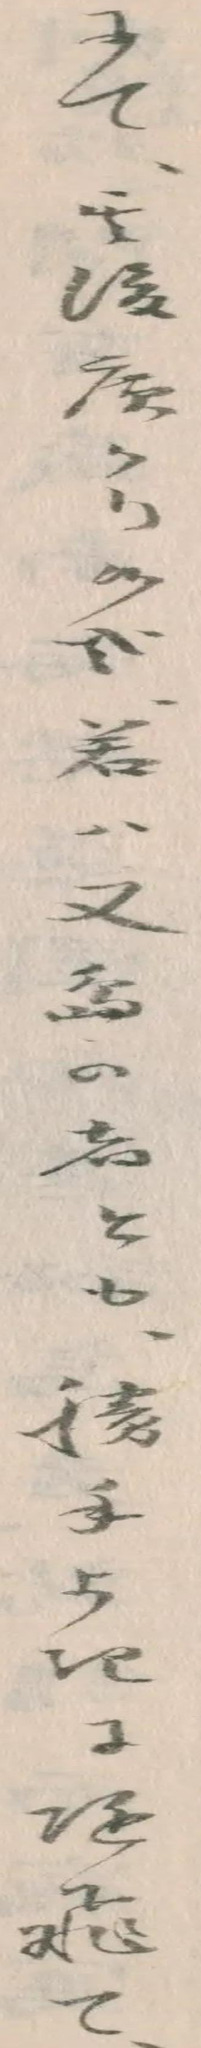にて、其後広かり候哉、若は又嶋の者とも、勝手よきに随ひて、
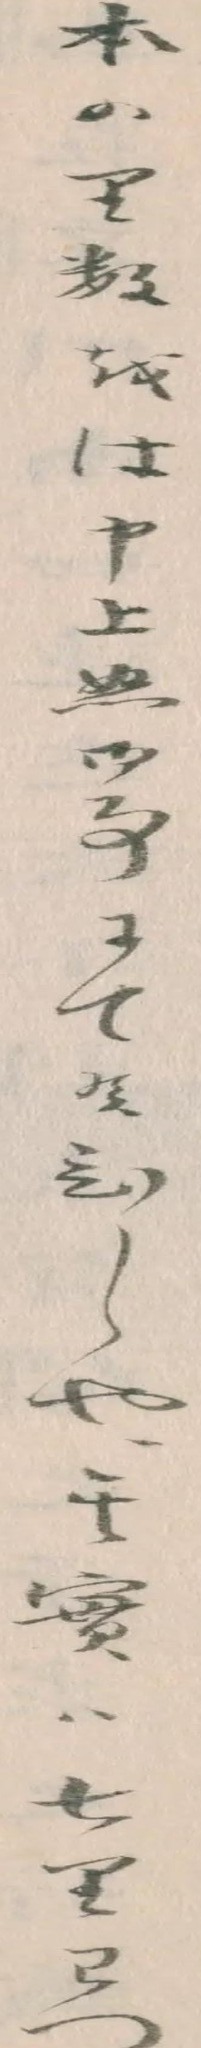本の里数をは申上ぬ御事にて候ひしや、其実は七里わつ
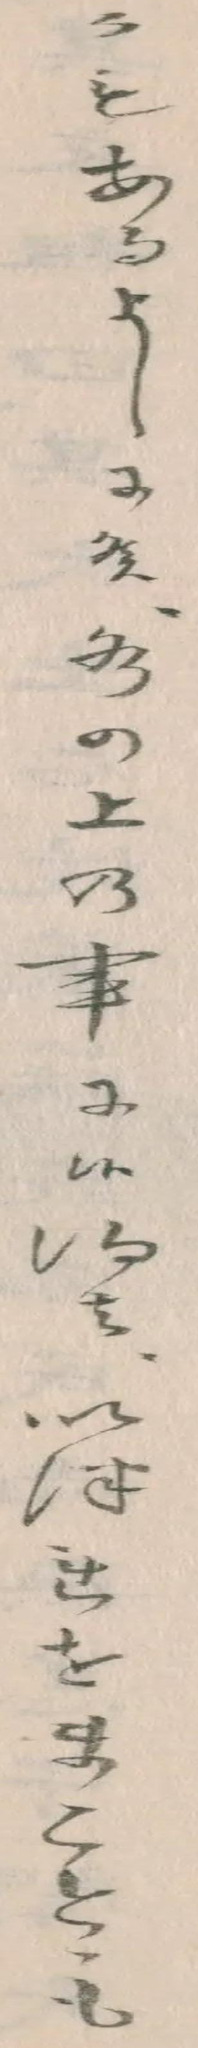かもあるよしに候、水の上の事に候えは、いつれをまことゝも
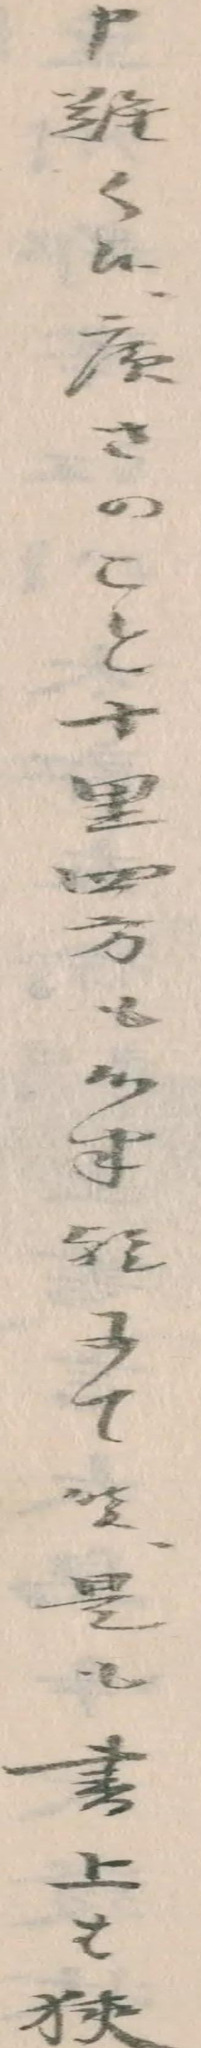申難く候、広さのこと十里四方も候半歟にて候、是も書上は狭
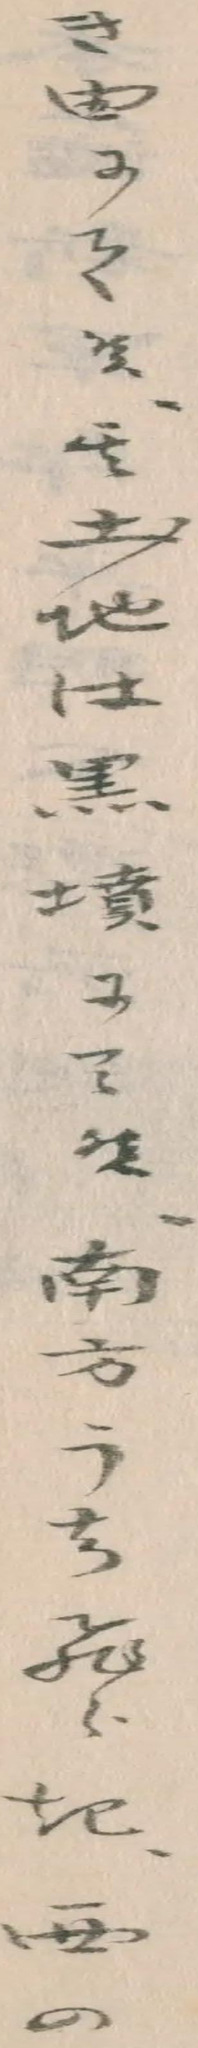き由にて候、其土地は黒墳にて候、南方うちひらき、西の
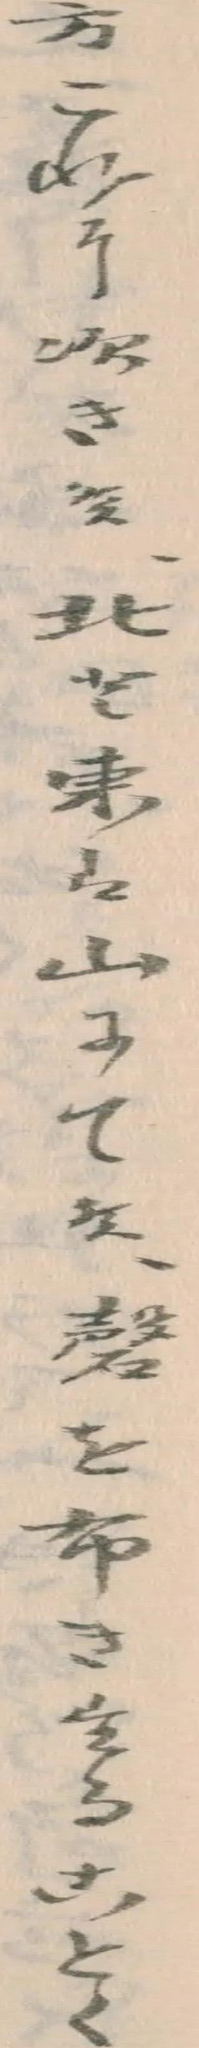方これに次き候、北と東は山にて候、磬を布きたることく
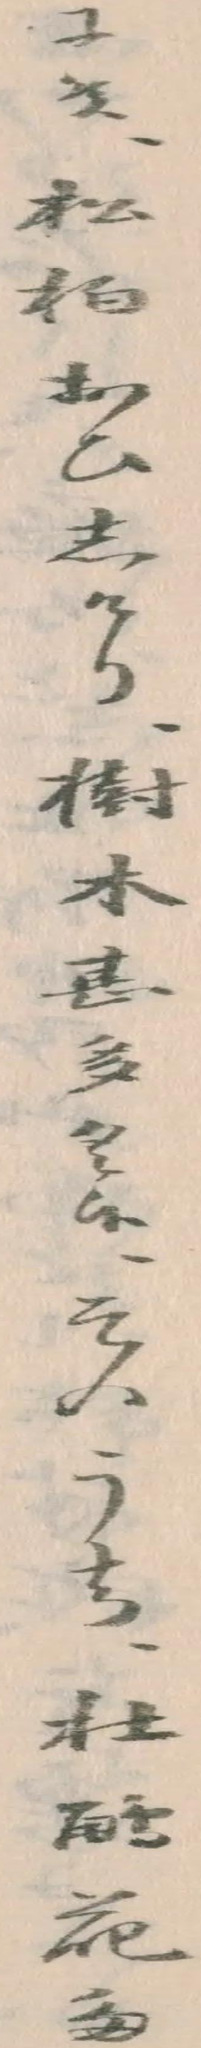に候、松柏おひしけり樹木甚多く候、そのうち、杜鵑花多
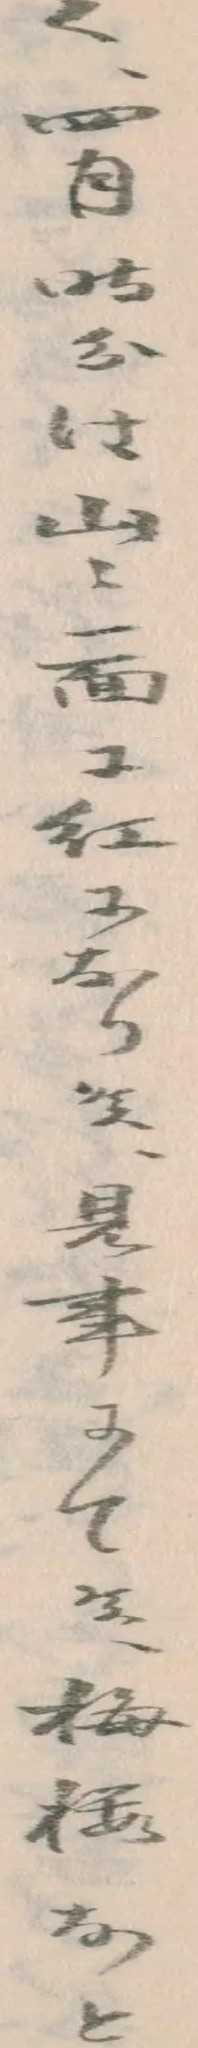く、四月時分は山々一面に紅になり候、見事にて候、梅桜なと
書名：地災撮要. 巻11-12(地震之部)
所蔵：国立国会図書館 National Diet Library, JAPAN
